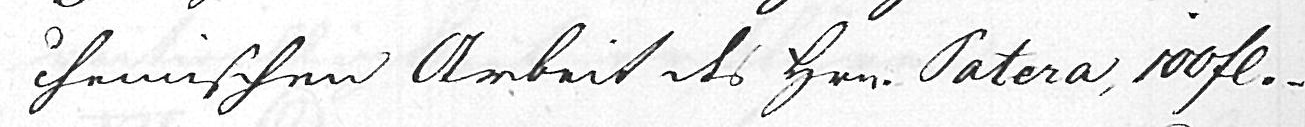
chemischen Arbeit der Hrn. Patera, 100 fl.
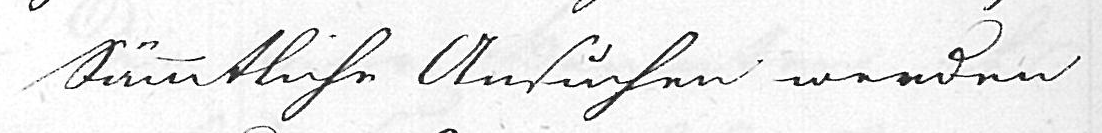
Sämmtliche Ansuchen werden
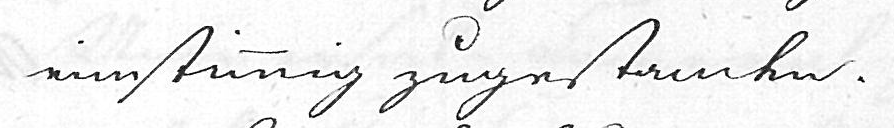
einstimmig zugestanden.
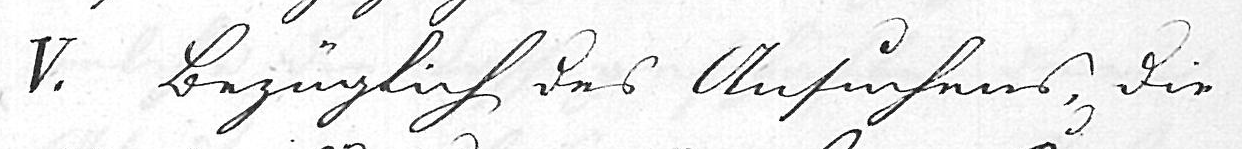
V. Bezüglich des Ansuchens, die
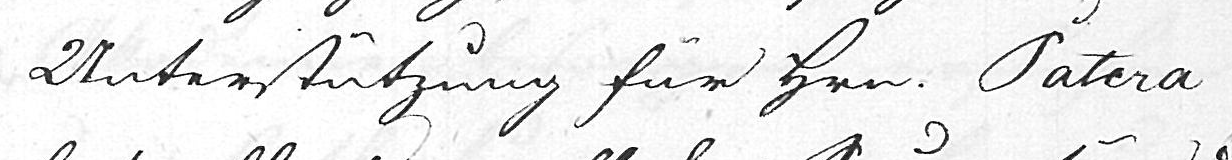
Unterstützung für Hrn. Patera
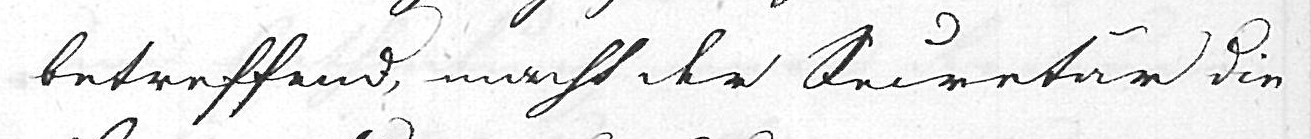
betreffend, macht der Secretär die
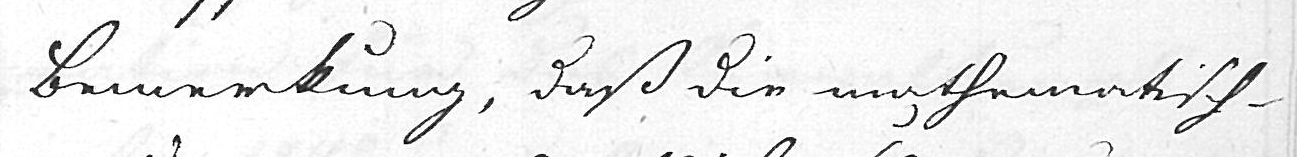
Bemerkung, daß die mathematisch-
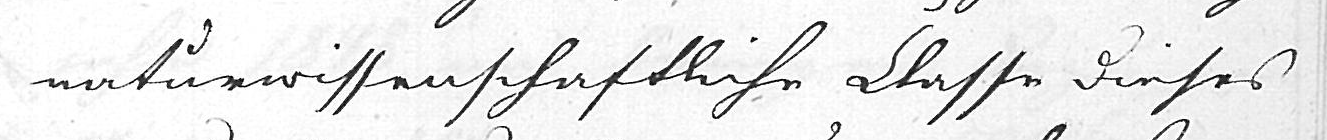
naturwissenschaftliche Classe dieses
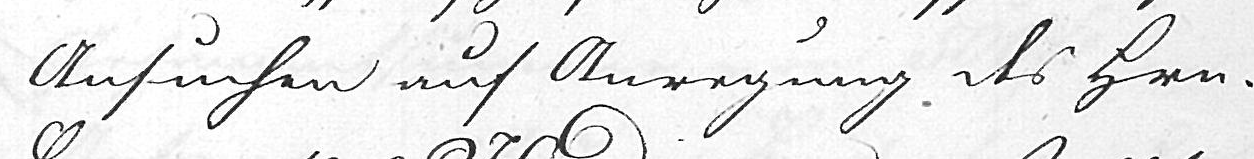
Ansuchen auf Anregung des Hrn.
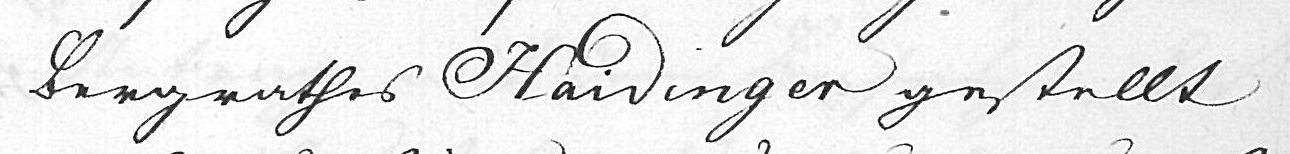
Bergrath Haidinger gestellt
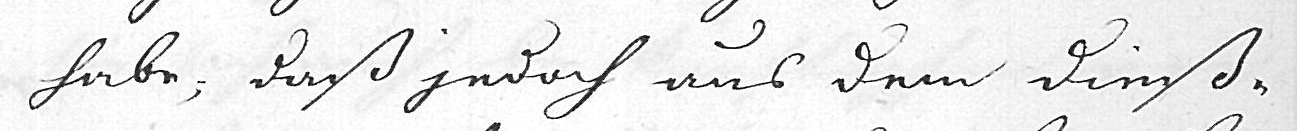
habe, daß jedoch aus dem dieß-
